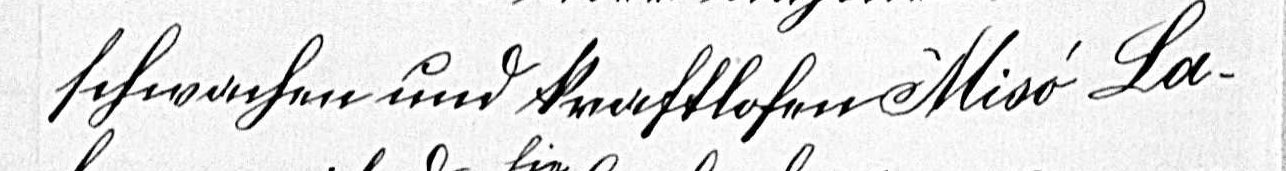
schwachen und kraftlosen Misó La¬
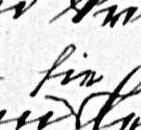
sie
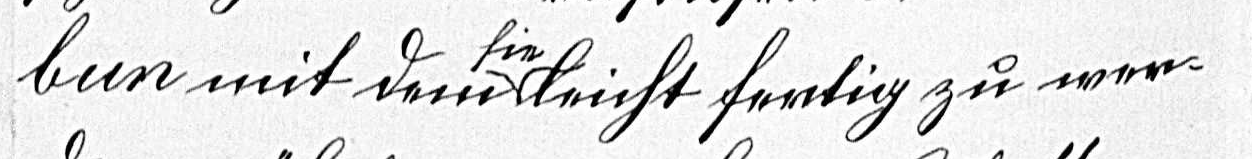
bun mit dem leicht fertig zu wer¬
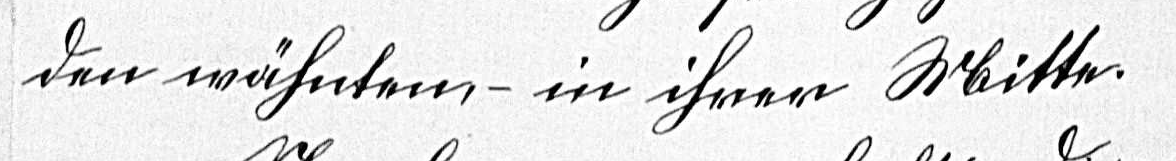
den wähnten,- in ihrer Witte.
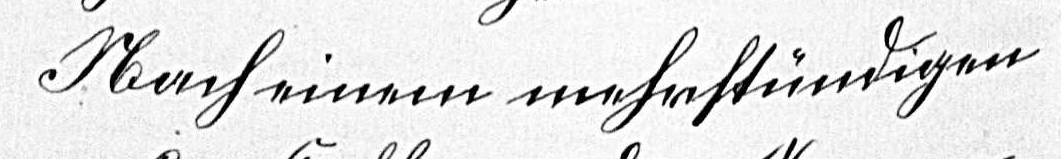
Nach einem mehrstündigen
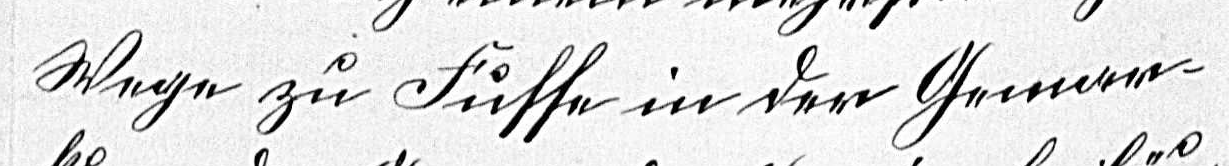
Wege zu Fusse in der Gemar¬
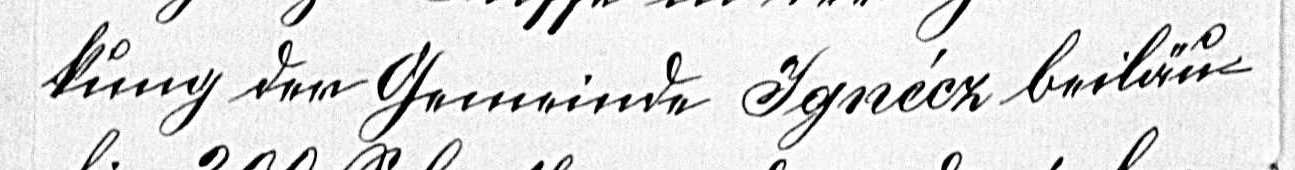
kung der Gemeinde Jgnécz beiläu¬
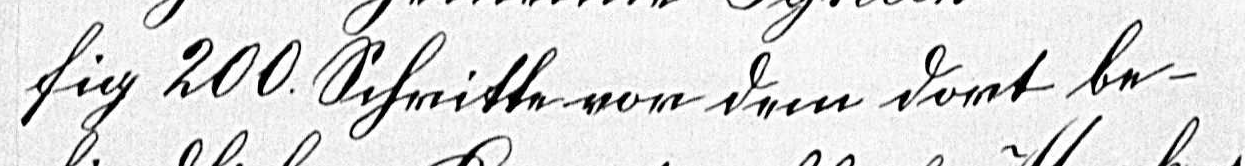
fig 200 Schritte vor dem dort be¬
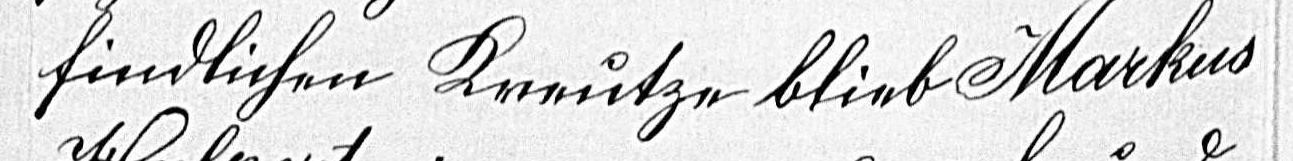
findlichen Kreutze blieb Markus
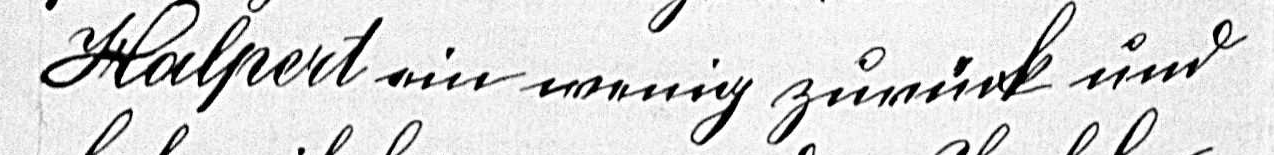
Hapert ein wenig zurück und
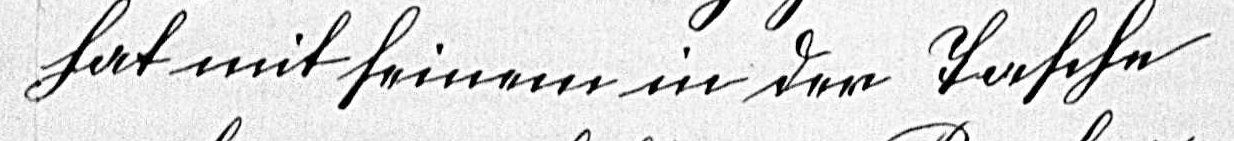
hat mit seinem in der Tasche
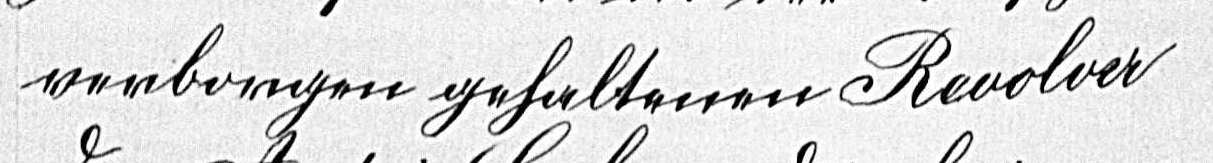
verborgen gehaltenen Revolver
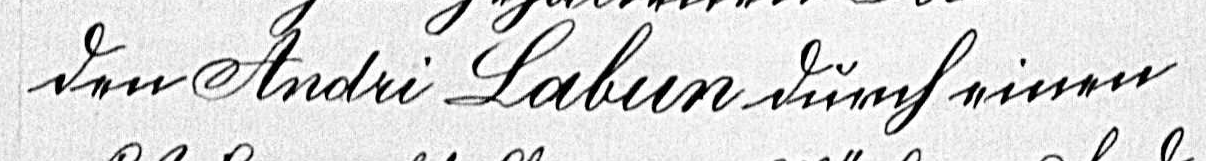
den Andri Labun durch einen
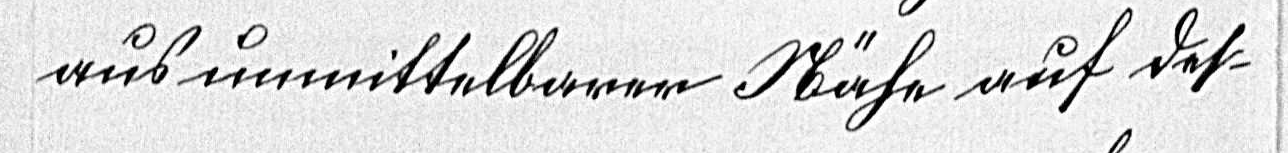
aus unmittelbarer Nähe auf des¬
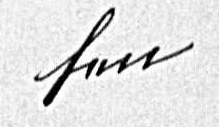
sen
